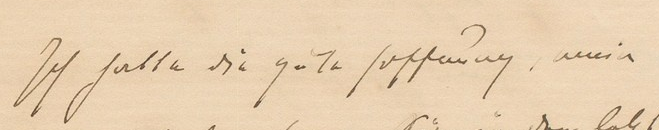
Ich hatte die gute Hoffnung, mein
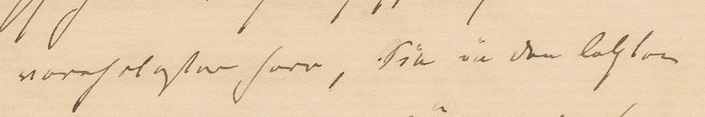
verehrtester Herr, Sie in den letzten
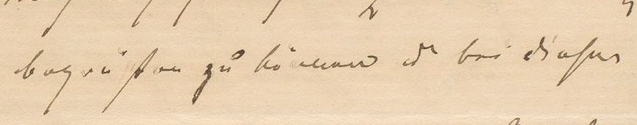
begrüßen zu können u bei dieser
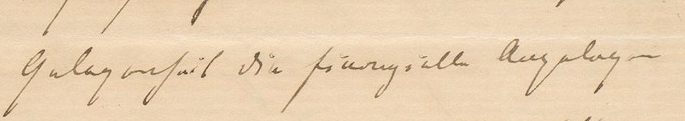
Gelegenheit die finanzielle Angelegen-
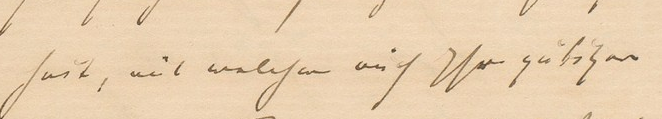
heit, mit welcher mich Ihr gütiger
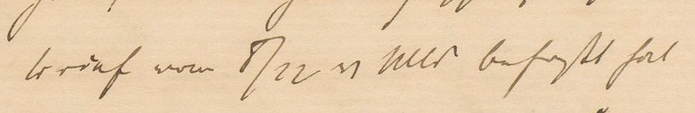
Brief vom 8ten vMts befaßt hat
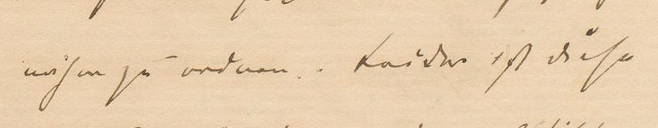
näher zu ordnen. Leider ist diese
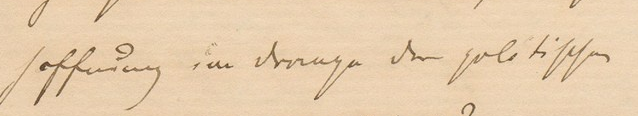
Hoffnung im Drange der politischen
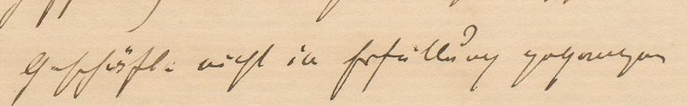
Geschäfte nicht in Erfüllung gegangen
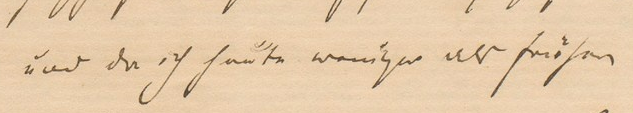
und da ich heute weniger als früher
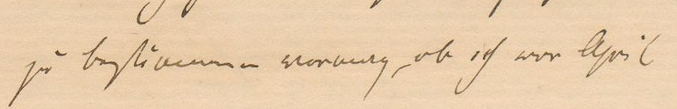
zu bestimmen vermag, ob ich vor April
